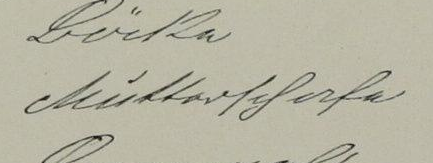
Mutterschafe
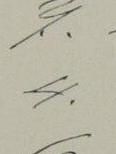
4
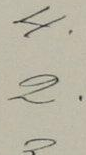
2
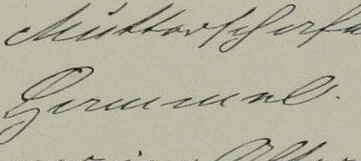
Hammel
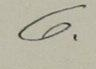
6
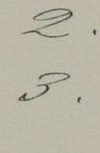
3
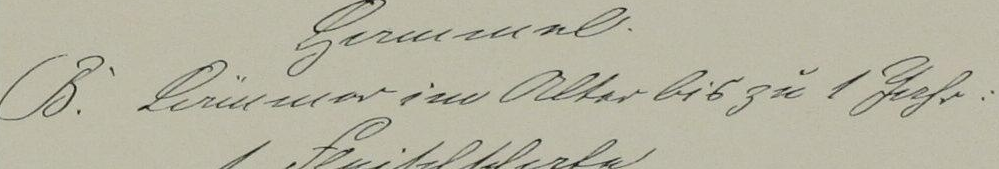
B. Lämmer im Alter bis zu 1 Jahr:
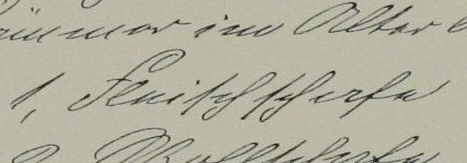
1. Fleischschafe
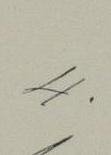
4
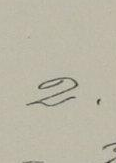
2
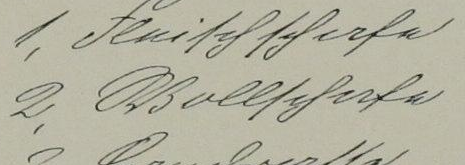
2. Wollschafe
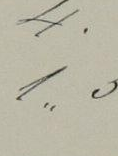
1
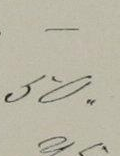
50
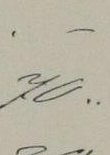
70
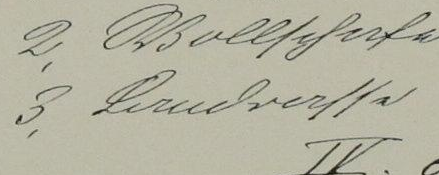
3. Landrasse
